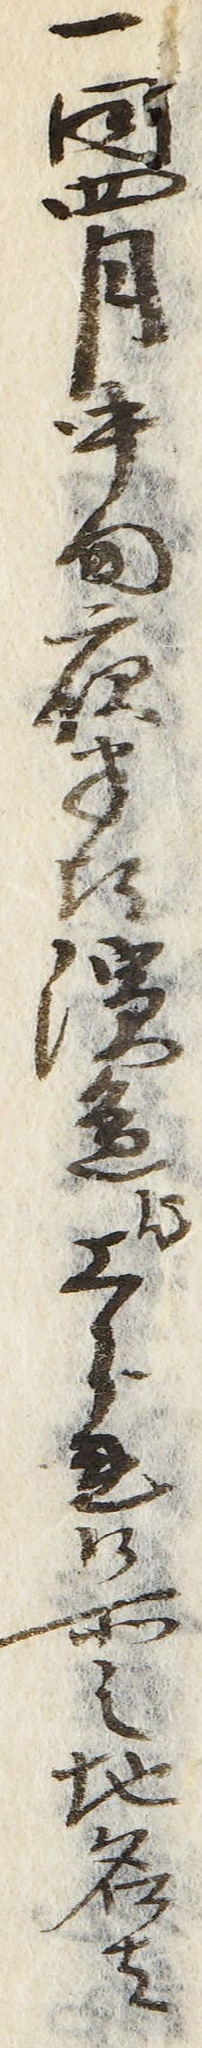一同四月中旬夜半頃濱邊江上られ候所之地名者
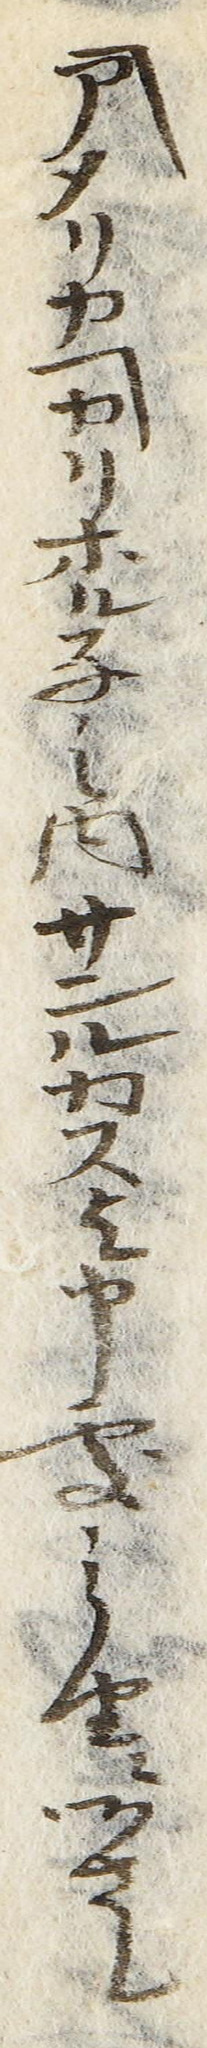「アメリカ「カリホル子之内サンルカスと申處之由ニ御座候
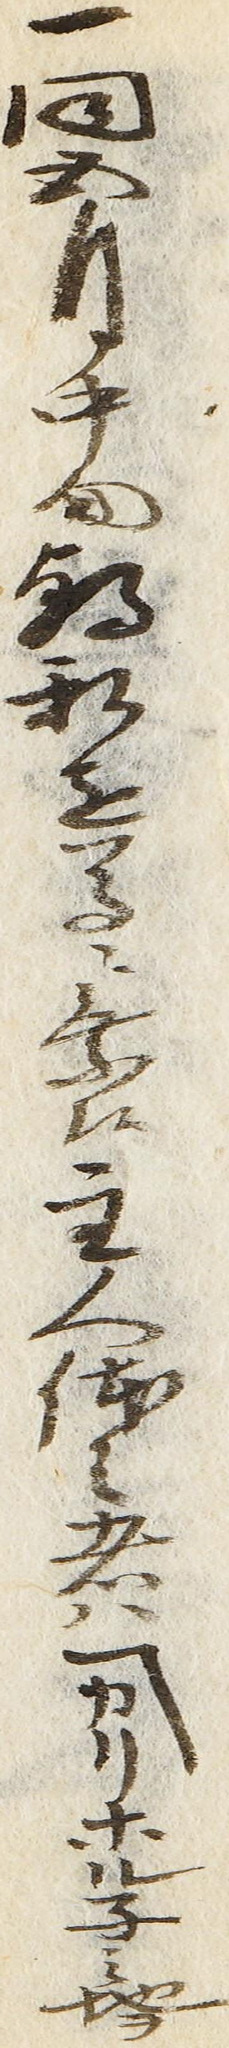一同五月中旬朝私を馬ニ乗候主人之者ハ「カリホル子之地ヲ
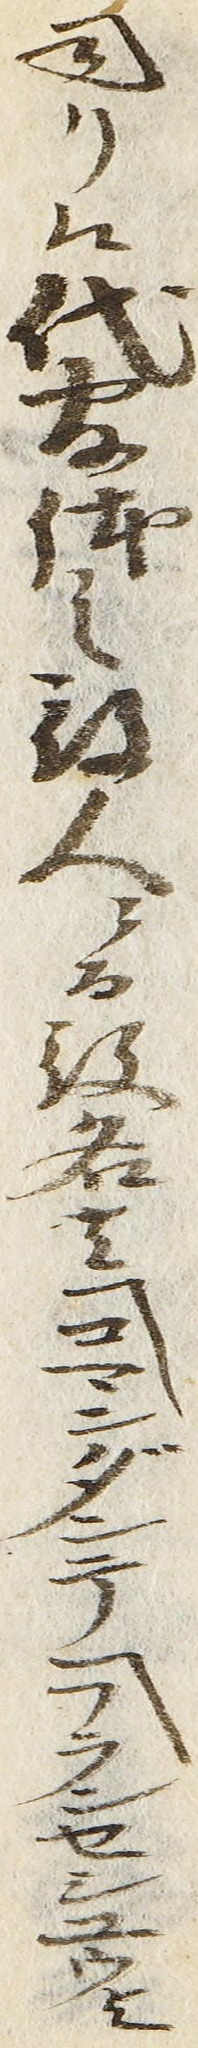司り候代官体之役人ニ而役名を「コマンダンテ「フランセシユウと
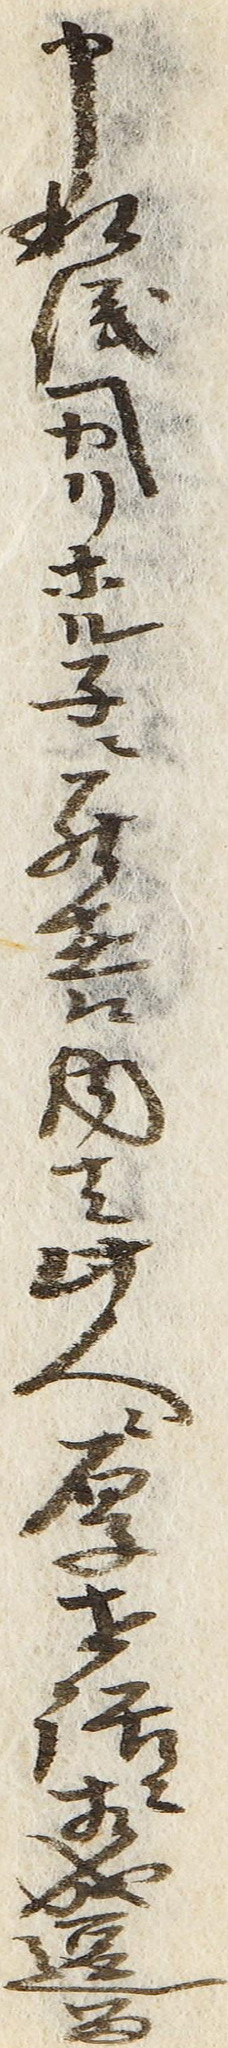申私儀「カリホル子ニ罷在候内者此人ニ厚世話ニ相成逗留
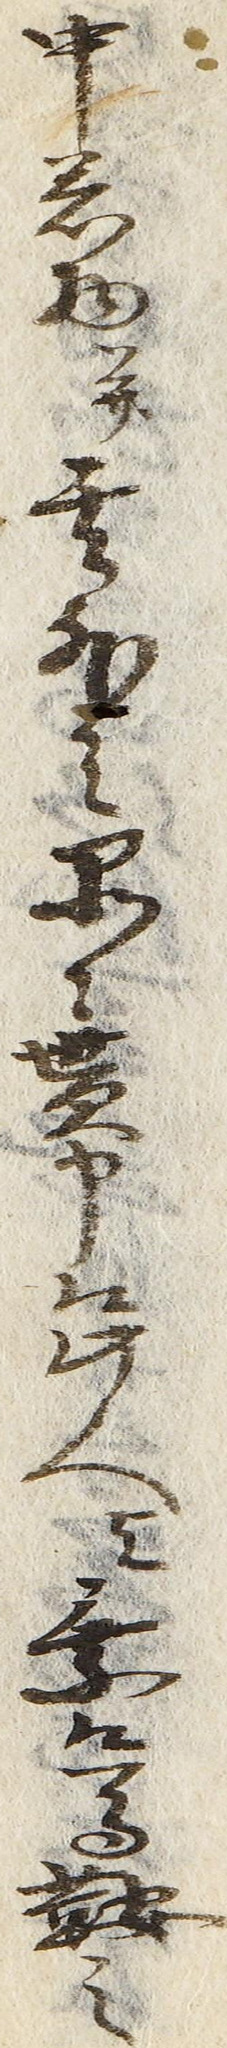中着物幷其外之品々貰申候此人と乗候馬鞍之
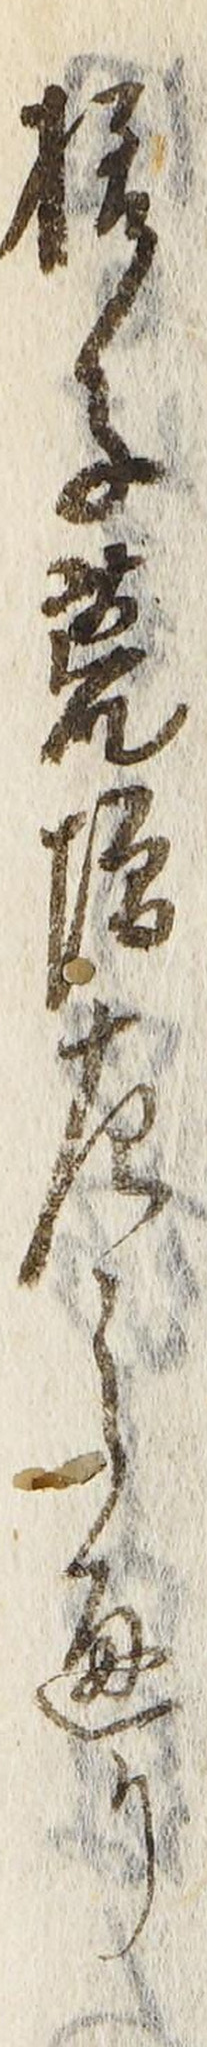様子荒増左之通り
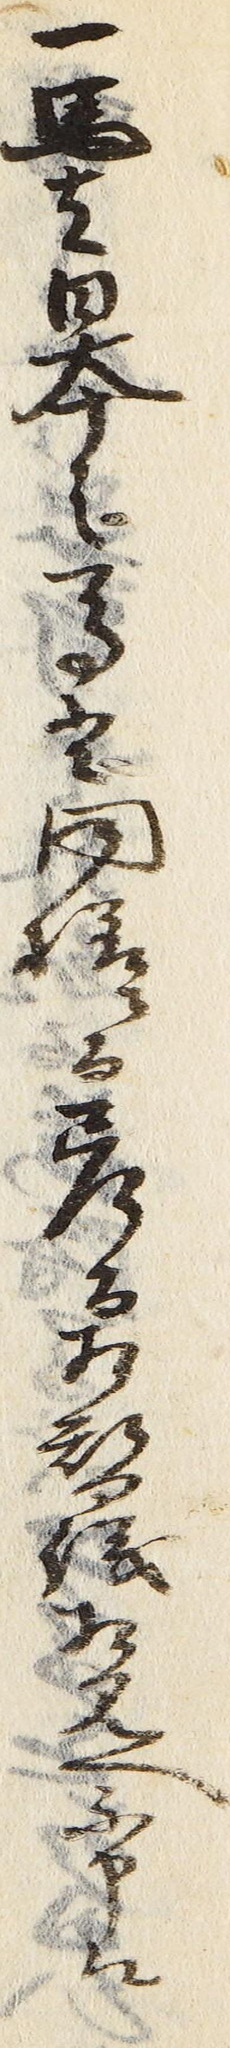一馬者日本之馬と同様にて差而相替儀相見へ不申候
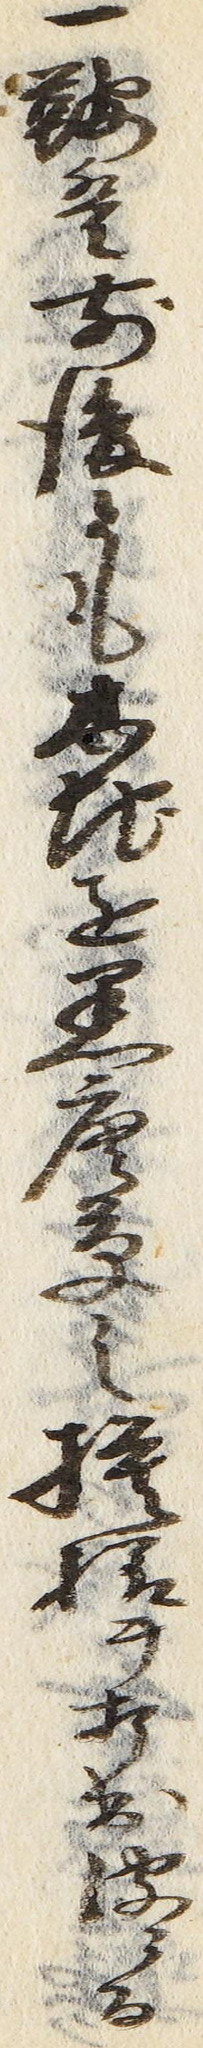一鞍は前後とも木地を黒唐草之模様ヲ打出皮ニ而
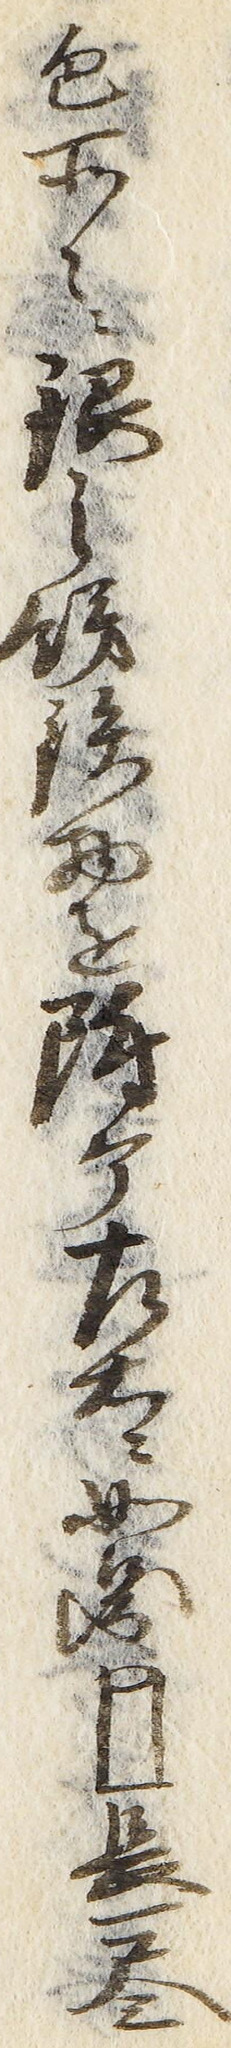包所々ニ銀之餝鉄物を附ケ左右ニ如圖長一尺三
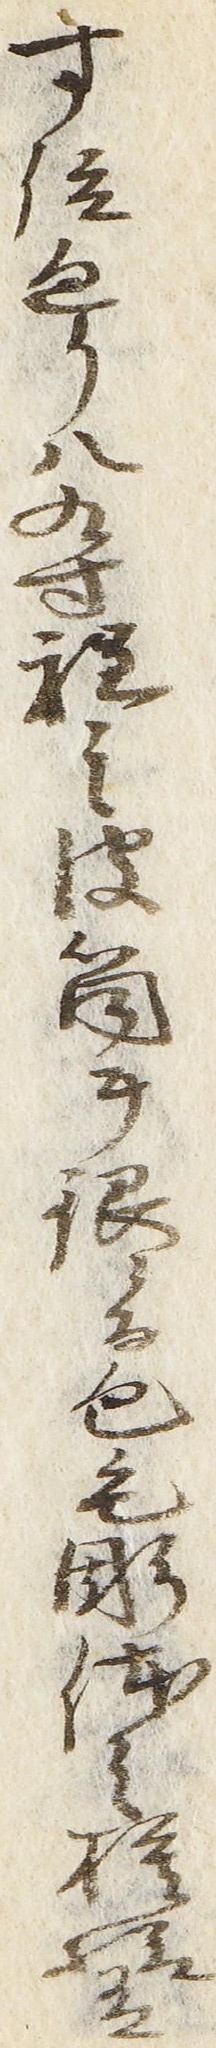寸位廻り八九寸程之皮筒ヲ銀ニ而包毛彫体之模様有
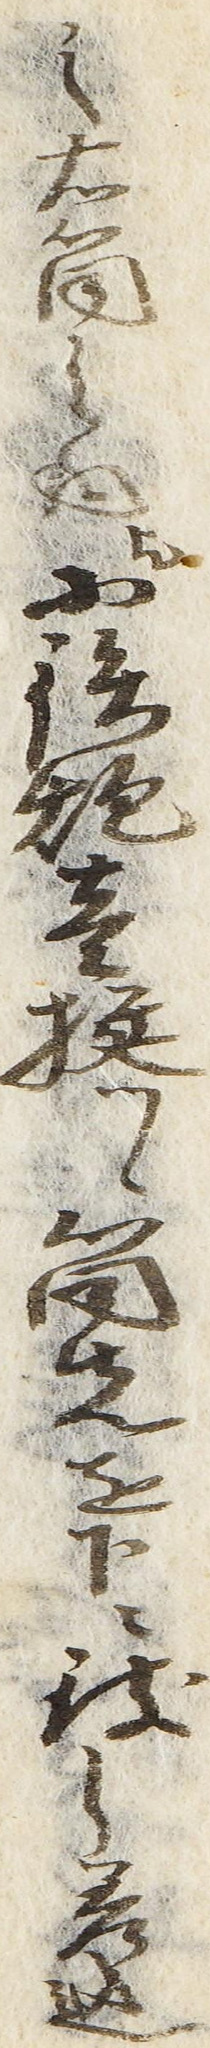之右筒之内江小鉄炮壱挺ツヽ筒先を下ニ致し差込
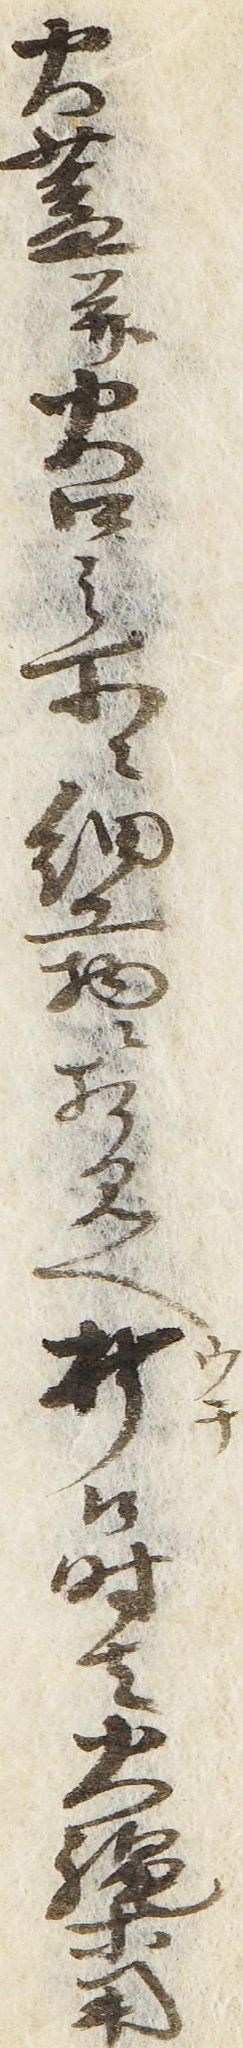火蓋幷火口之所ニ細工物ニ相見へ打候時者火縄等用
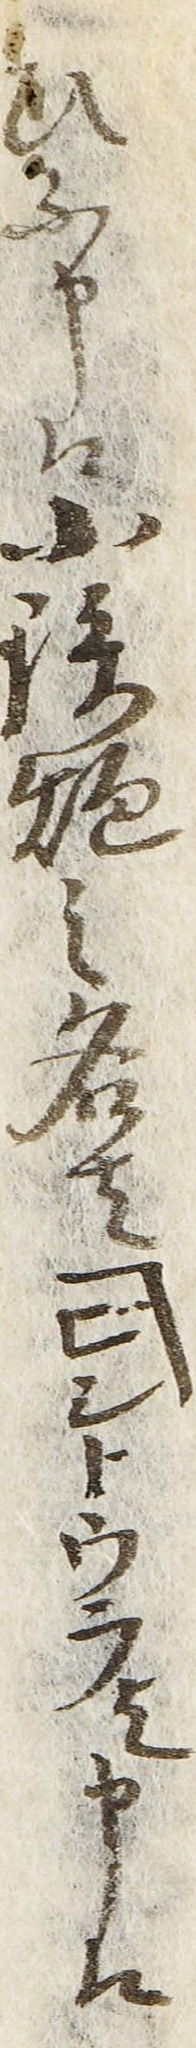ひ不申候小鉄炮之名者「ビシトウラと申候
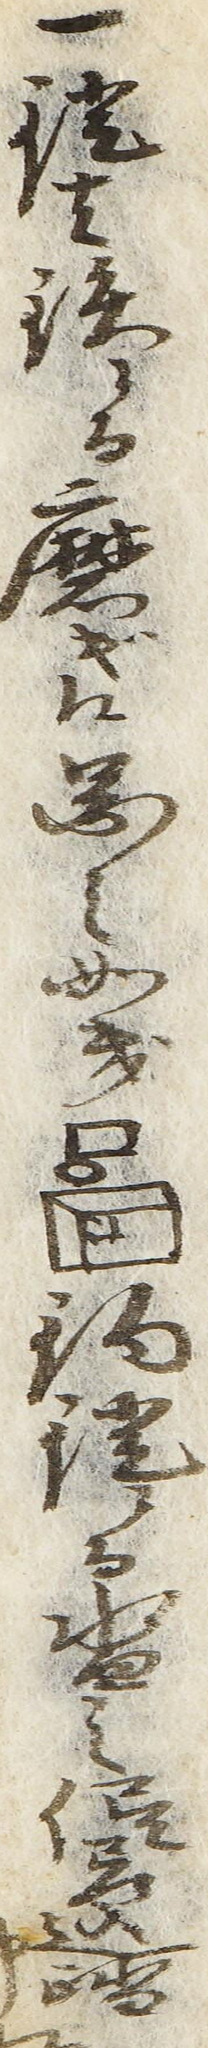一鐙者鉄にて磨ギ候圖之如き釣鐙ニ而沓之儘差込踏申候
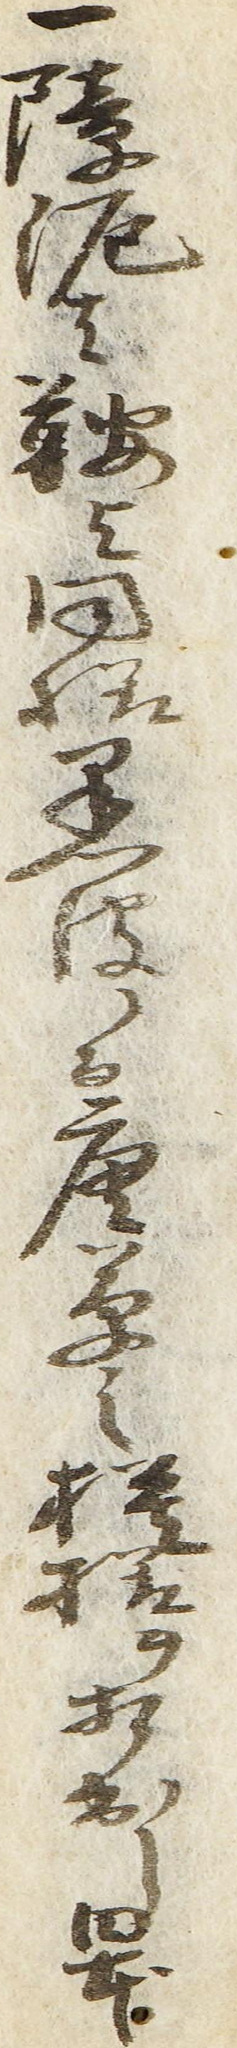一障泥者鞍と同様黒皮ニ而唐草之模様ヲ打出し日本
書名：漂流人善助聞書
